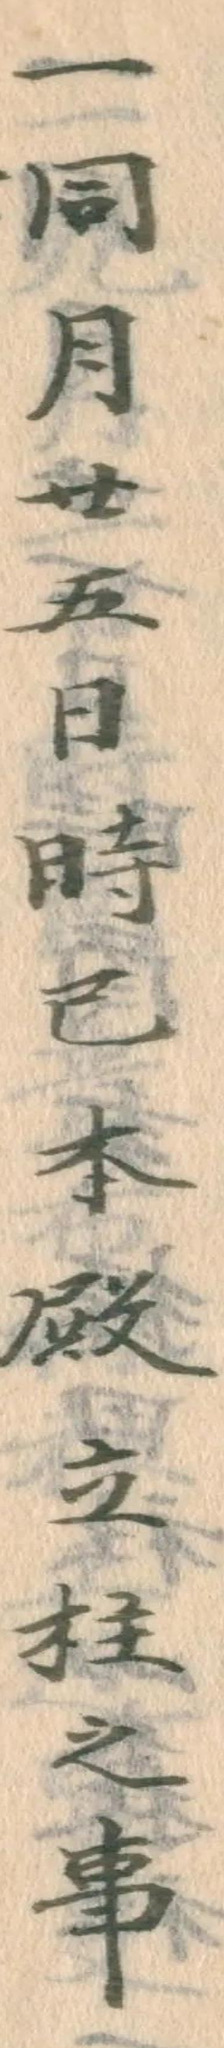一同月廿五日時巳本殿立柱之事
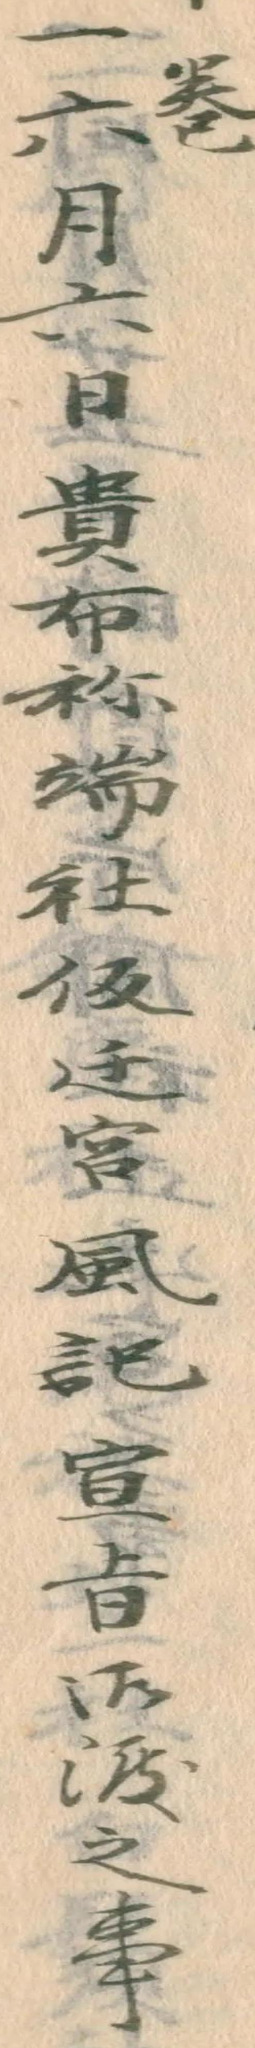一六月六日貴布祢端社仮迁宮風記宣旨御渡之事
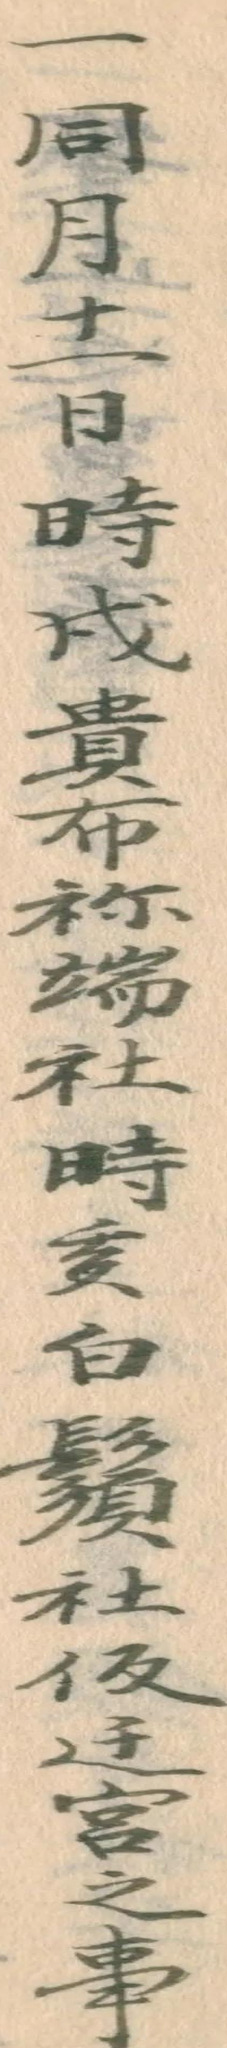一同月十一日時戌貴布祢端社時亥白鬚社仮迁宮之事
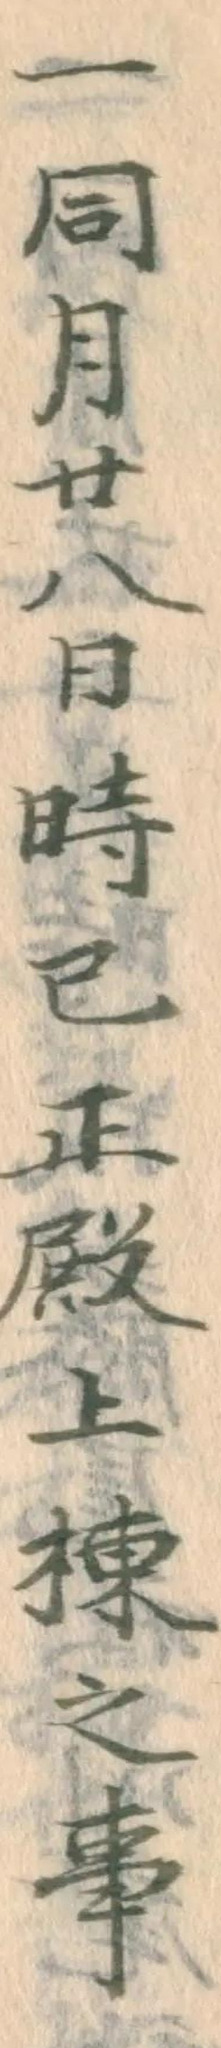一同月廿八日時巳正殿上棟之事
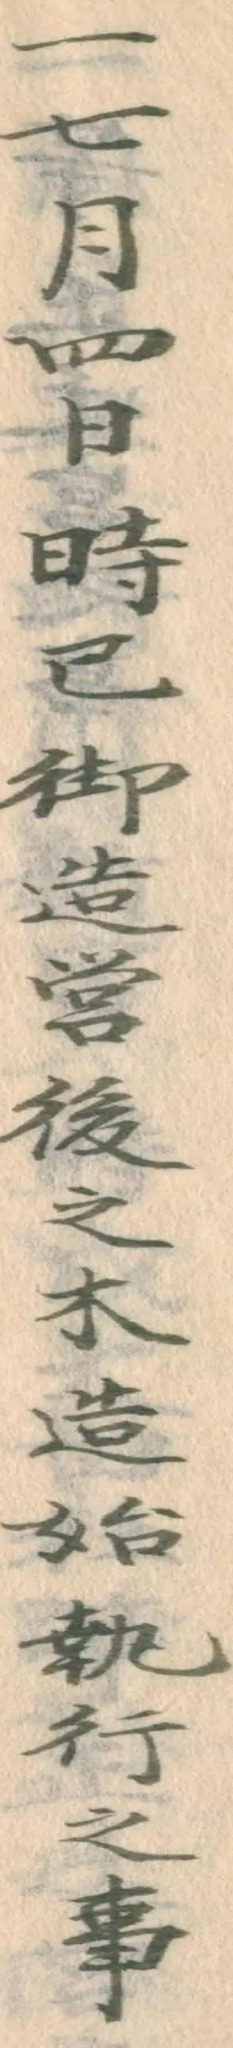一七月四日時巳御造営後之木造始執行之事
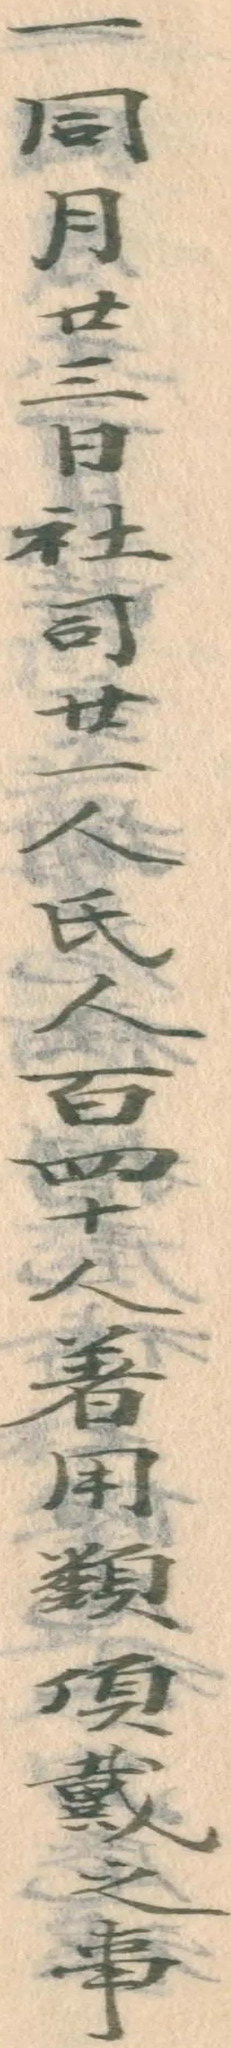一同月廿三日社司廿一人氏人百四十人着用類頂戴之事
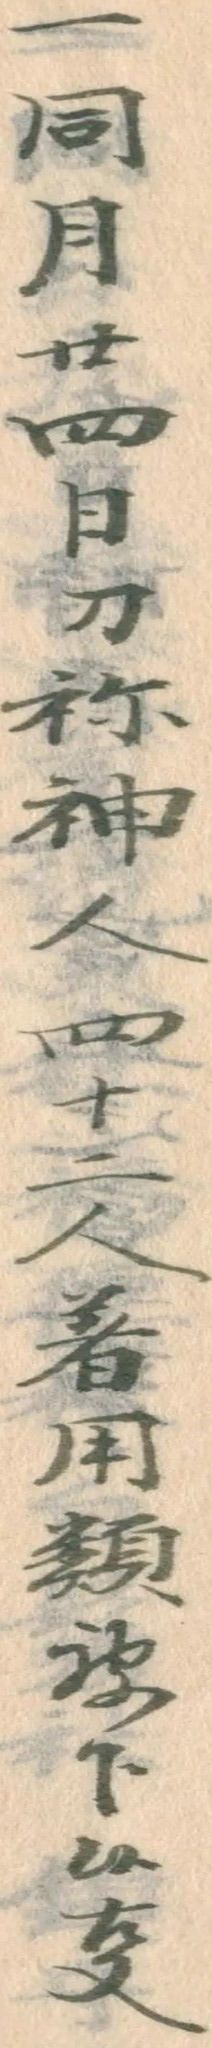一同月廿四日刀祢神人四十二人着用類被下候事
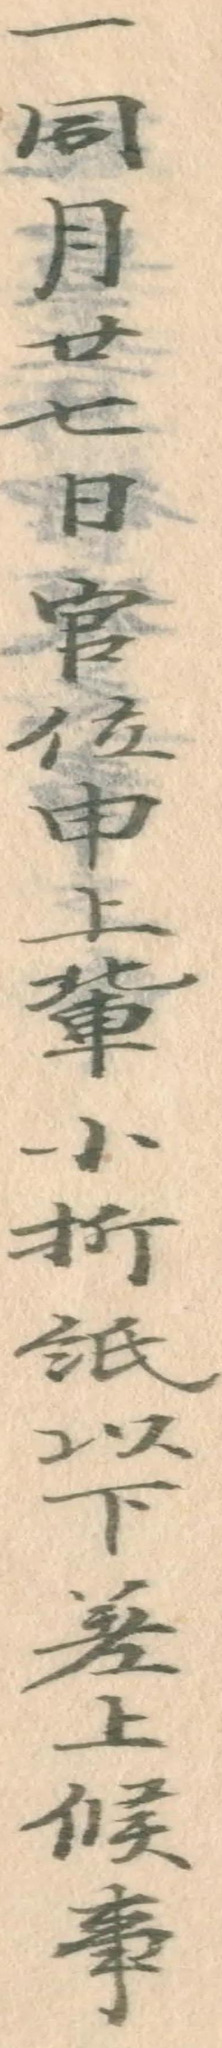一同月廿七日官位申上輩小折紙以下差上候事
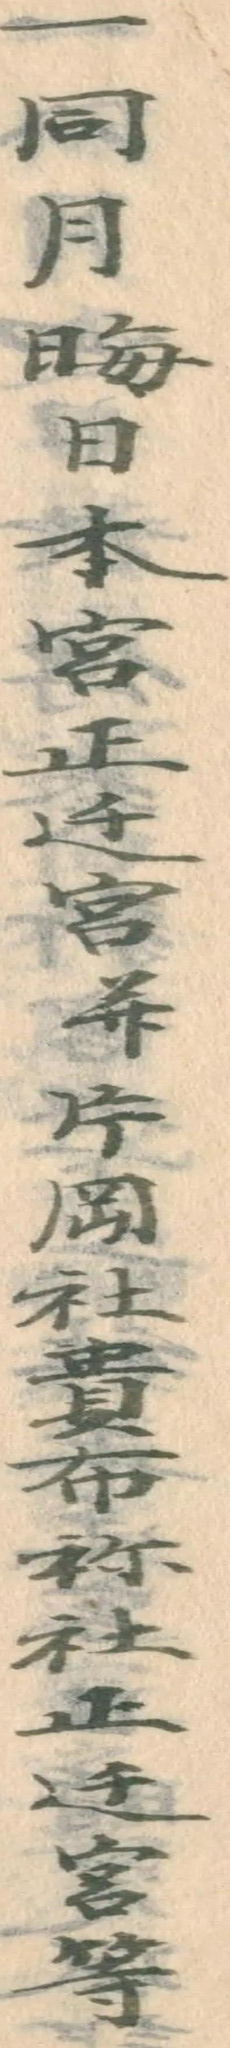一同月晦日本宮正迁宮并片岡社貴布称社正迁宮等
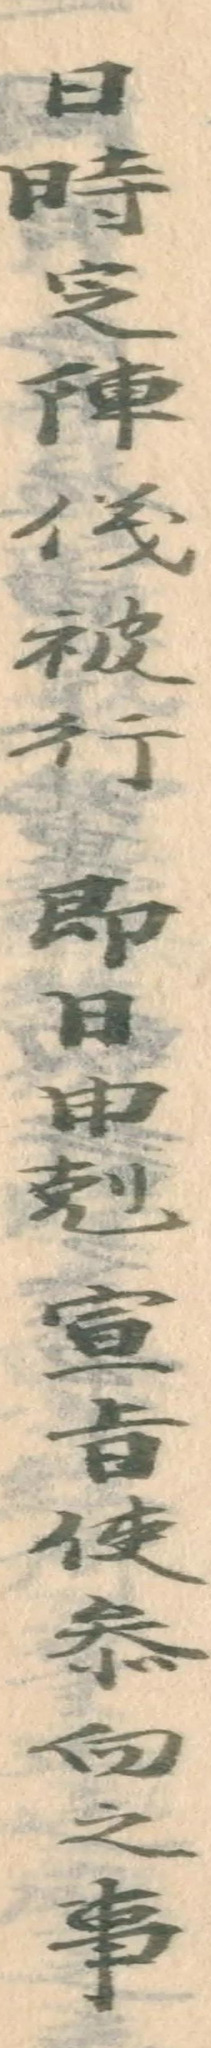日時定陣儀被行即日申剋宣旨使参向之事

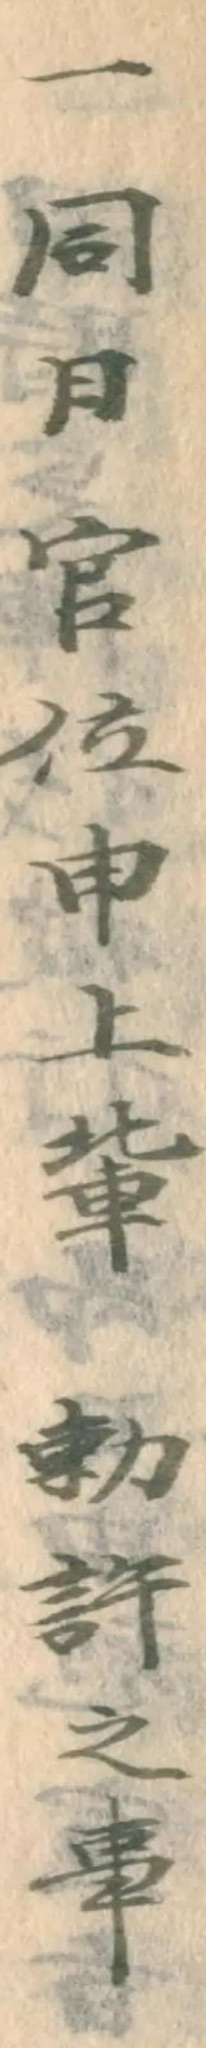一同日官位申上輩勅許之事
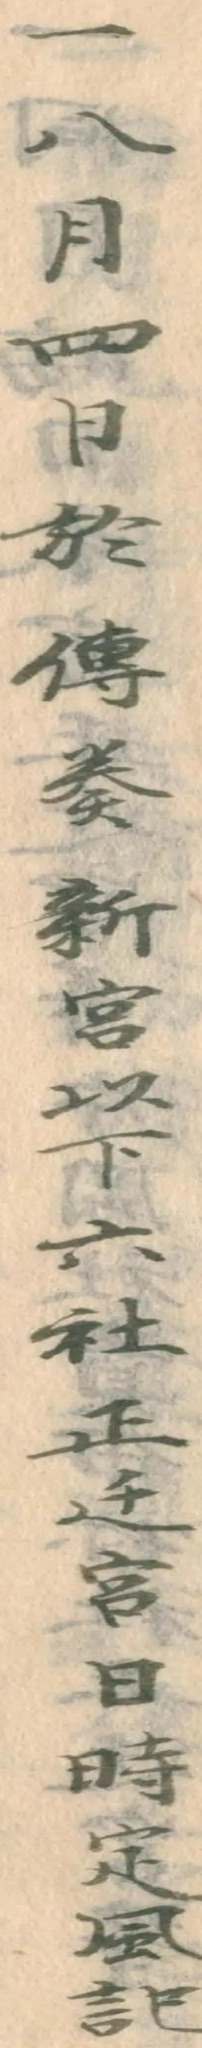一八月四日於伝奏新宮以下六社正迁宮日時定風記
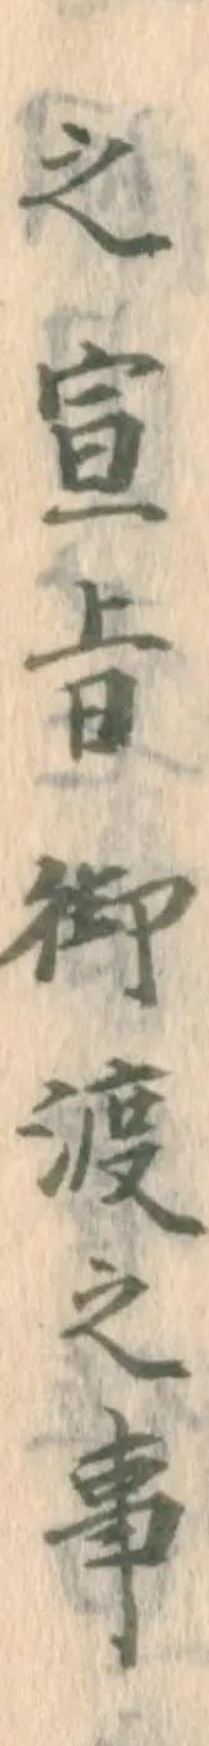之宣旨御渡之事
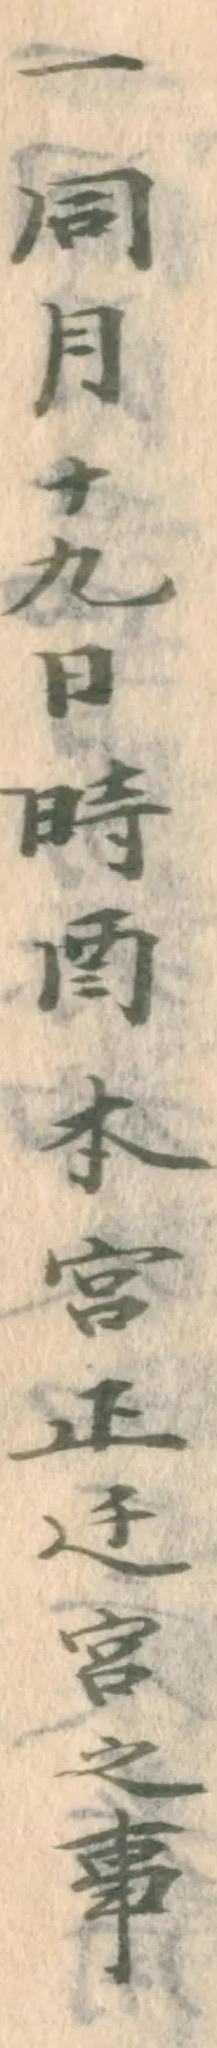一同月十九日時酉本宮正迁宮之事
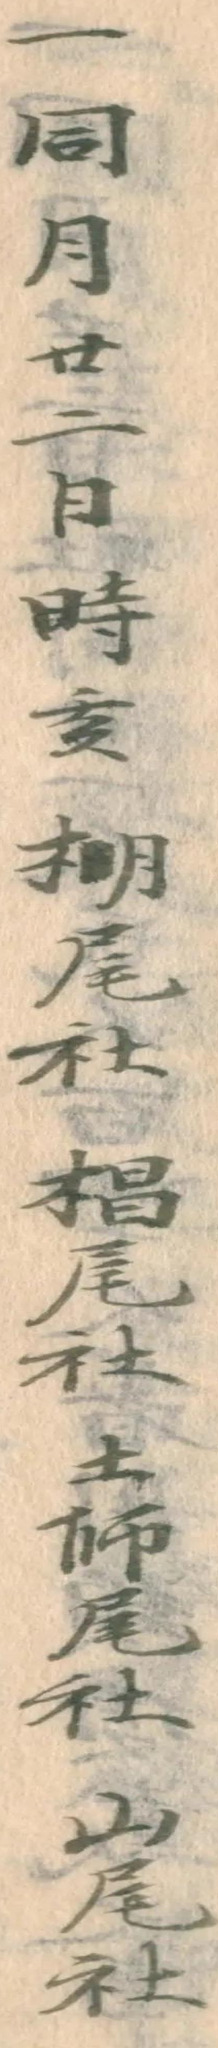一同月廿二日時亥棚尾社椙尾社土師尾社山尾社
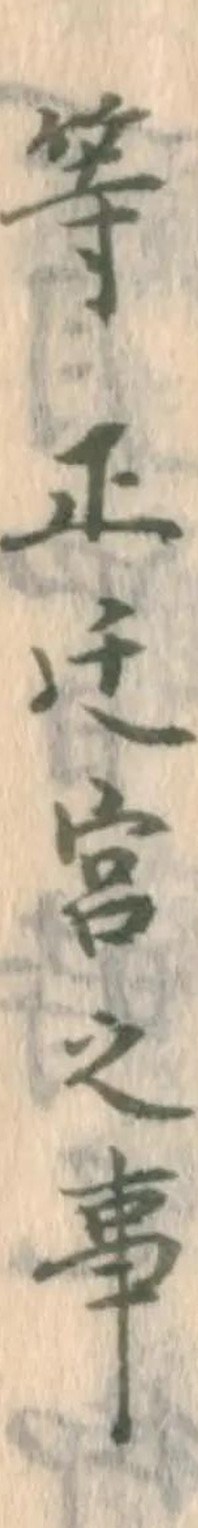等正迁宮之事
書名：賀茂社記録. 第17冊
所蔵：国立国会図書館 National Diet Library, JAPAN
